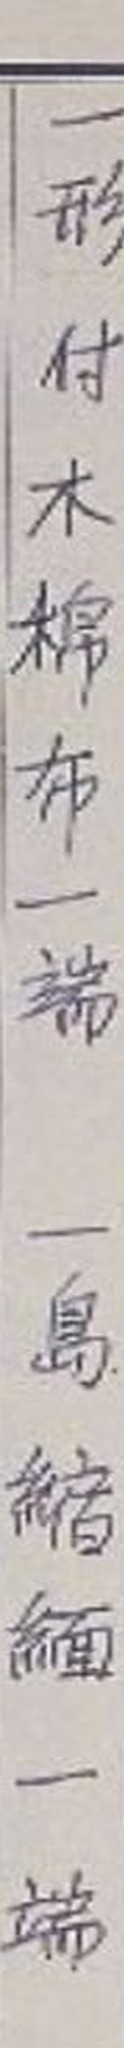一形付木棉布一端一島縮緬一端
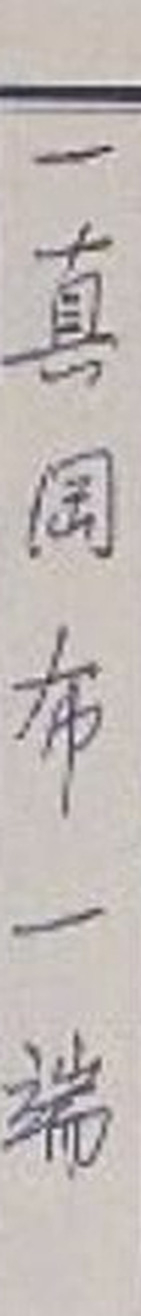一真岡布一端
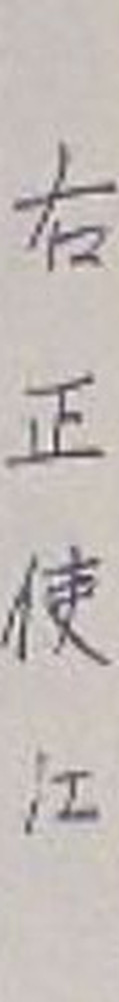右正使え
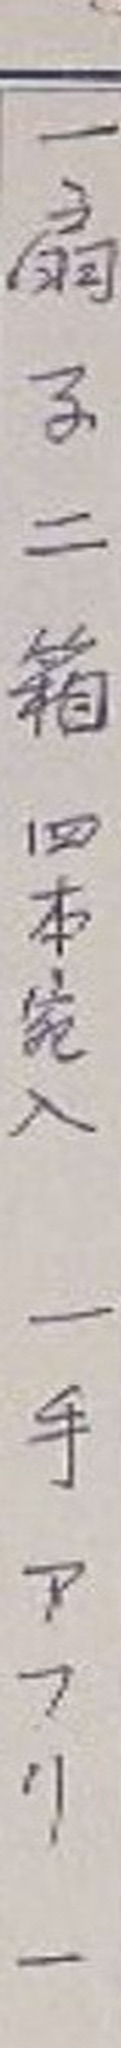一扇子二箱四本宛入一手あふり一
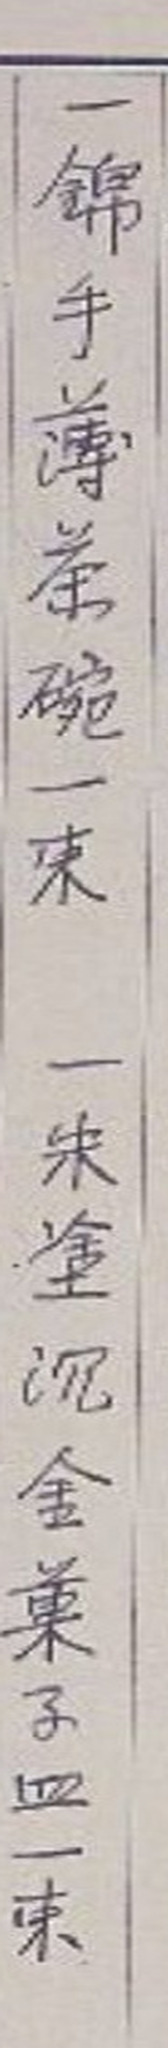一錦手薄茶碗一束一朱塗沈金菓子皿一束
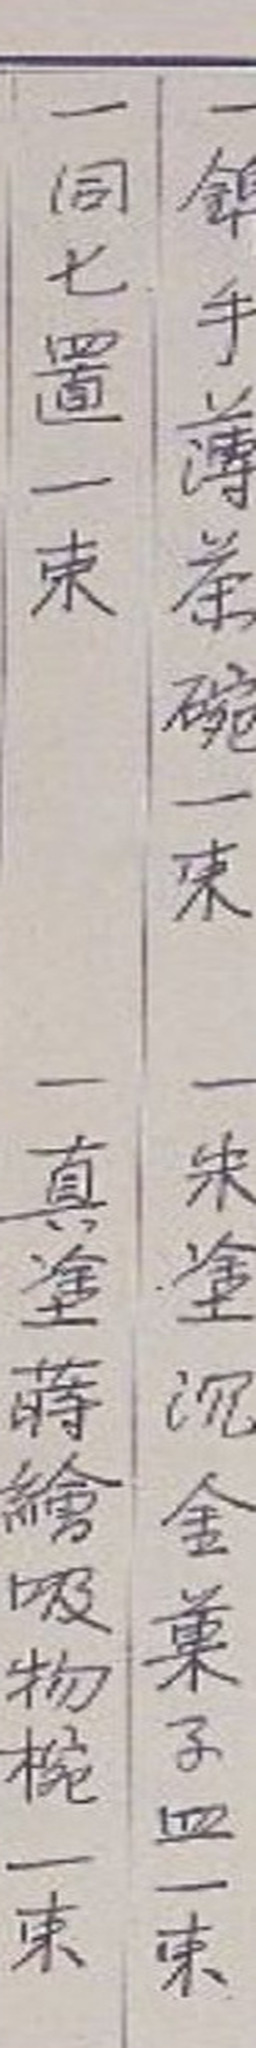一同匕置一束一真塗蒔絵吸物椀一束

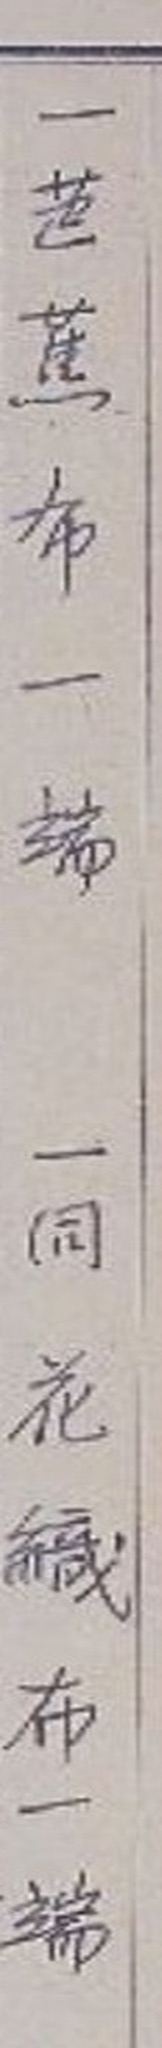一芭蕉布一端一同花織布一端
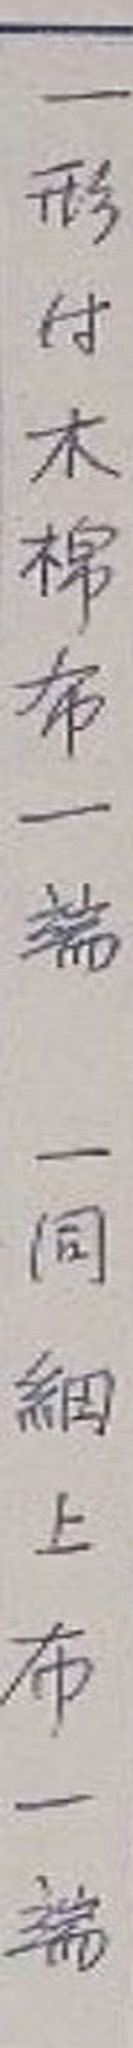一形付木棉布一端一同細上布端
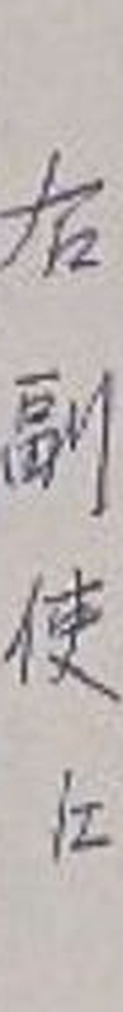右副使え
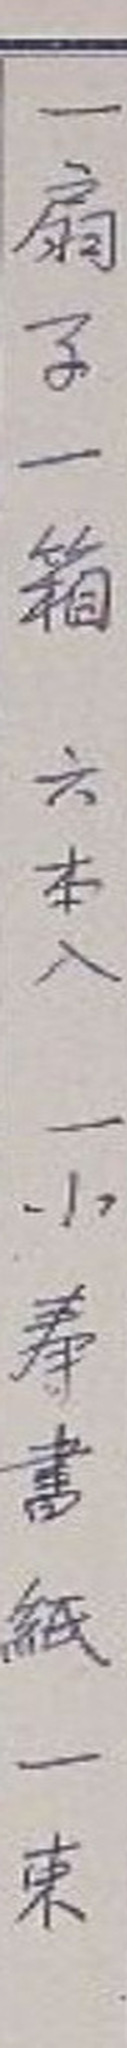一扇子一箱六本入一小奉書紙一束
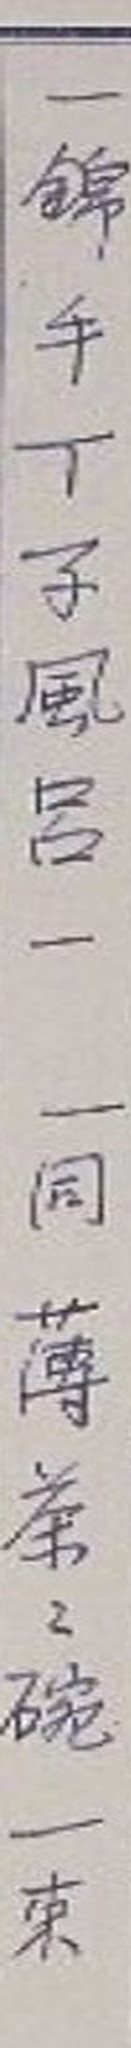一錦手丁子風呂一一同薄茶々碗一束
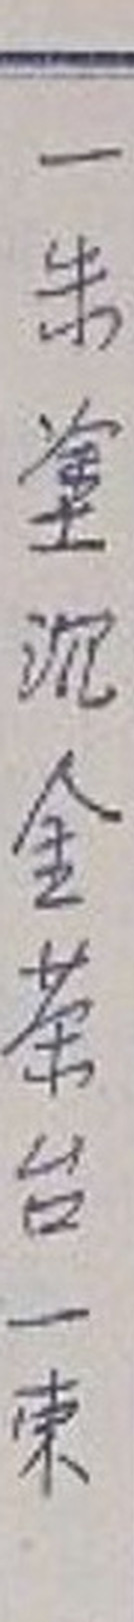一朱塗沈金茶台一束
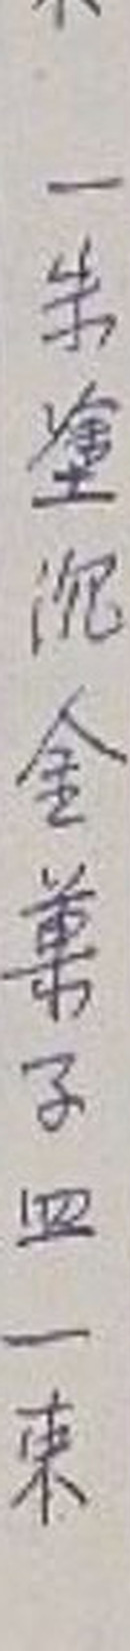一朱塗沈金茶台一束
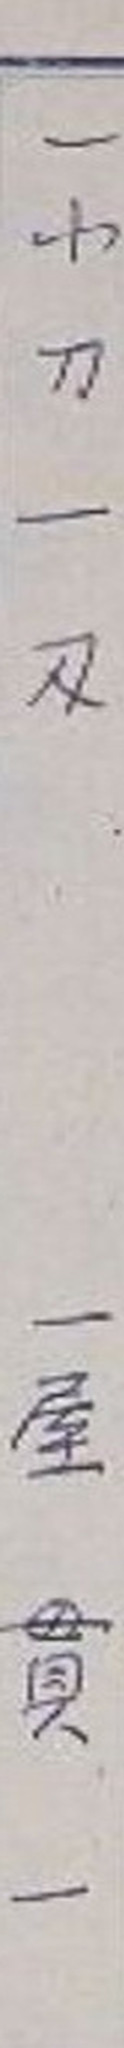一小刀一刃一屋貫一
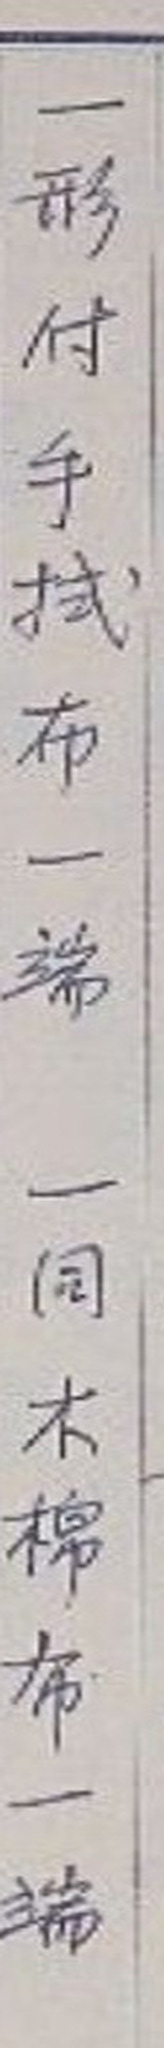一形付手拭布一端一同木棉布一端
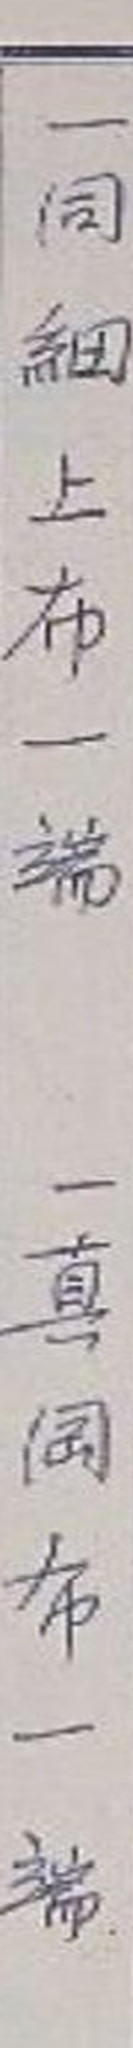一同細上布一端一真岡布一端
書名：支那冊封使来琉諸記 下巻
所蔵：University of the Ryukyus Library
